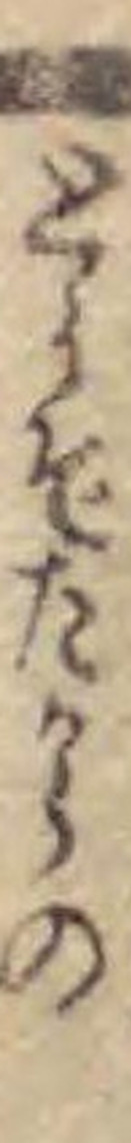とうぞたからの
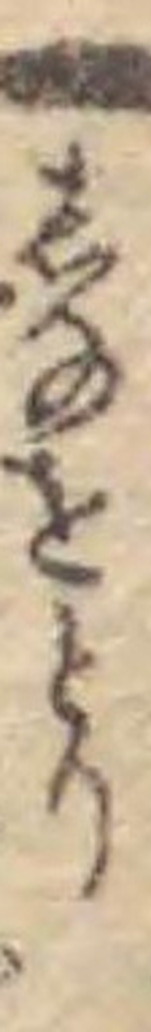しなをとり
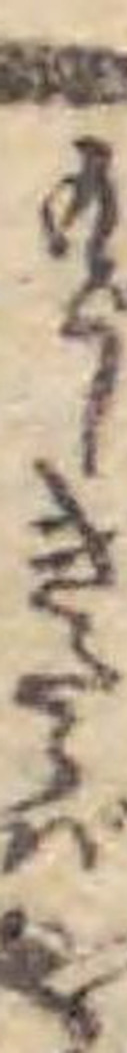もどしきたらば
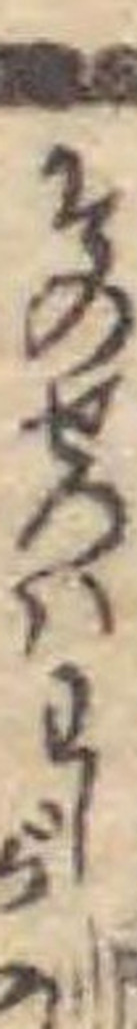そのせつはわしが
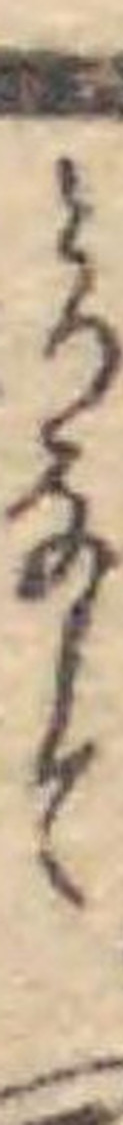とりなして
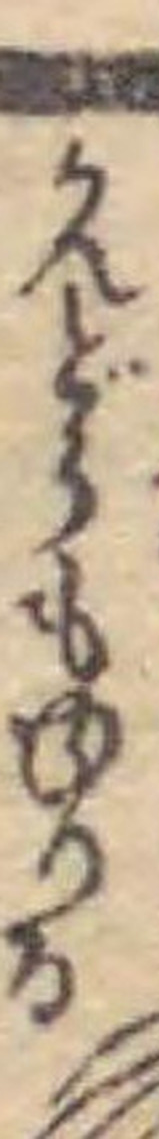くわんどうもゆりる
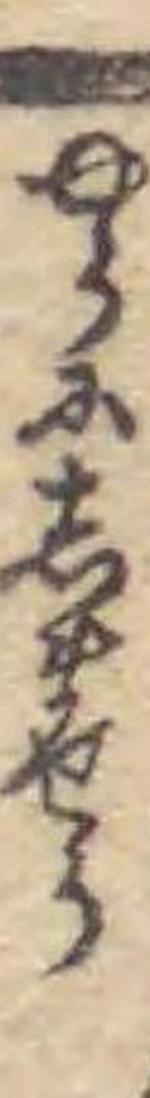やうにしませう
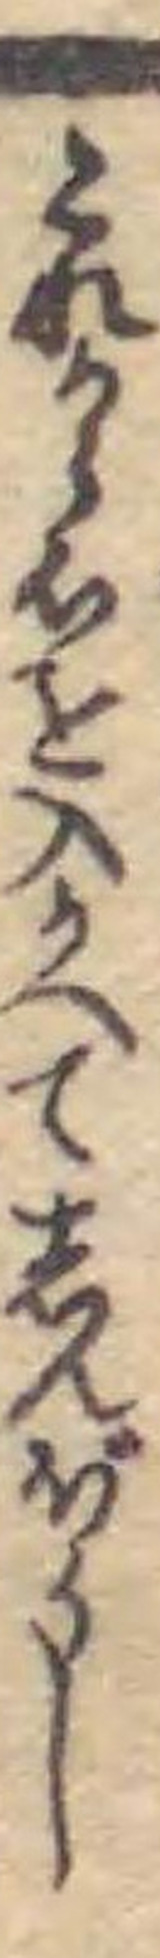これから心を入かへてしんぼうし
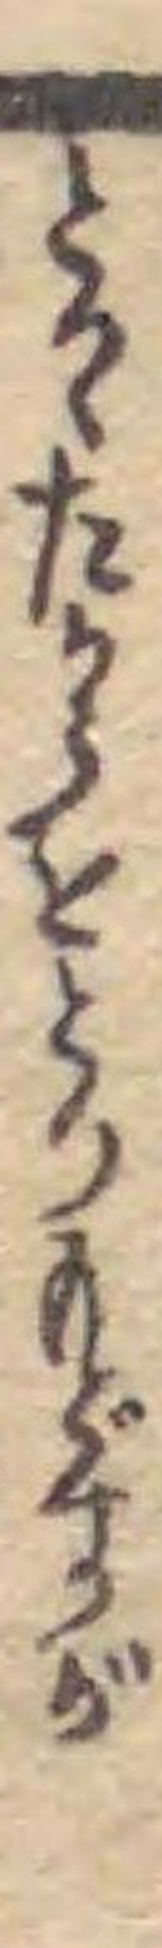とかくたからをとりもどすが
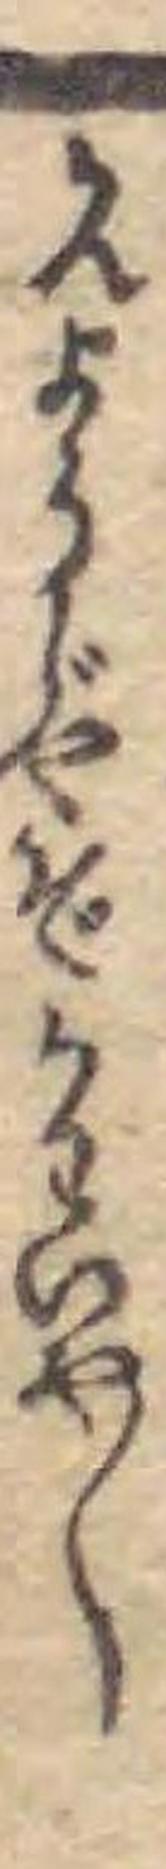かんようじやぞかわいや〳〵
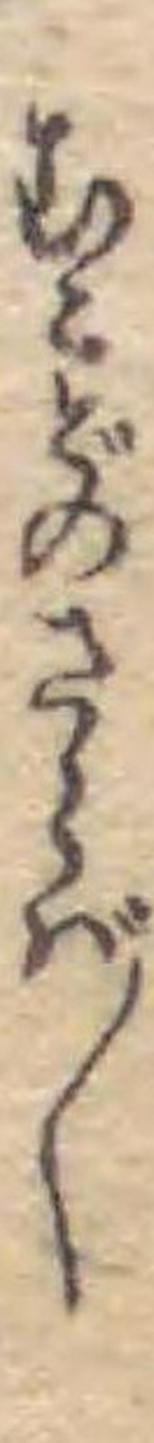むこどのさらば〳〵
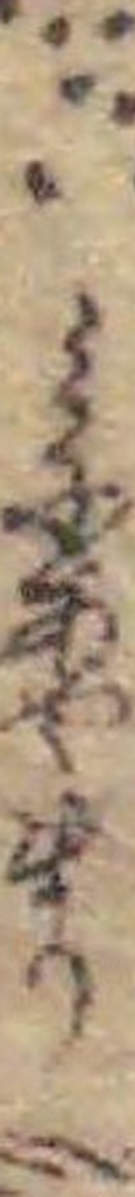みにあやまり
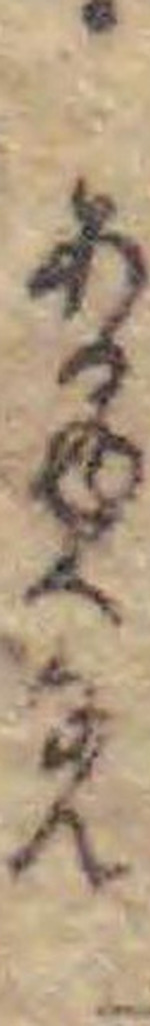あるゆへなん
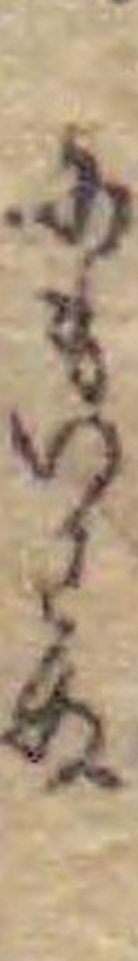にもいわぬ
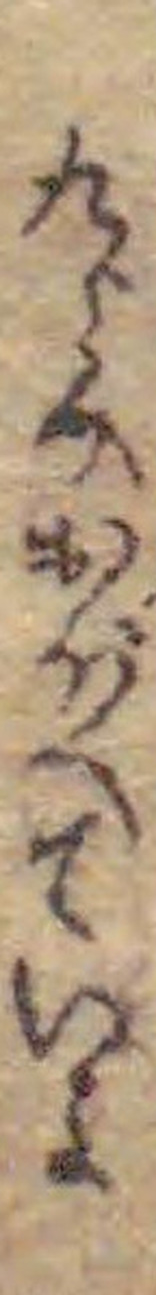九郎介おほへていよ
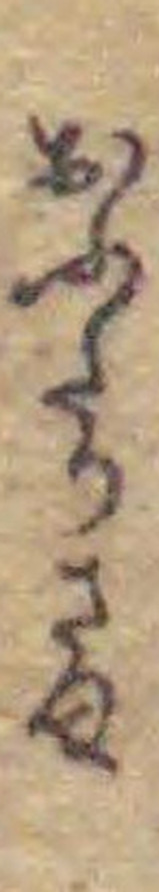おふたりさま
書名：扨化狐通人 : 2巻
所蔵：国立国会図書館 National Diet Library, JAPAN
